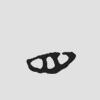四
